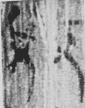敓（奪）
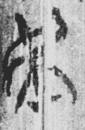民
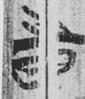○（時）
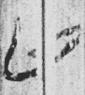㠯（以）
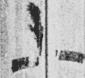土
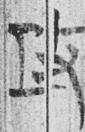攻（功）
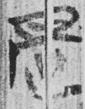是
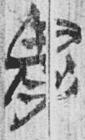{胃刀}（謂）
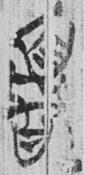○（稽）
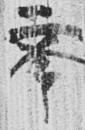不
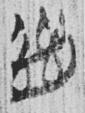○（絕）
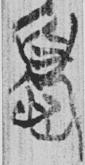○（憂）
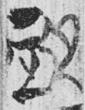卹（恤）
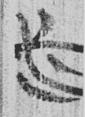必
